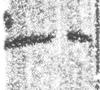一
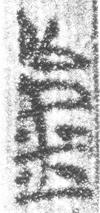○（盤）
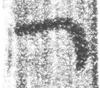一
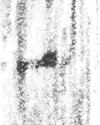一
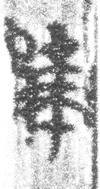銖
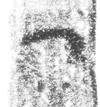一
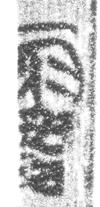靁（罍）
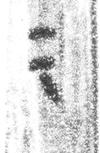亓（其）
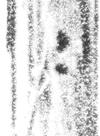木
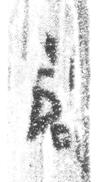器
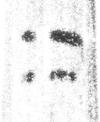二
